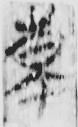東
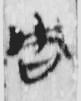周
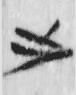之
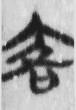客
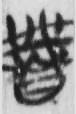○（許）
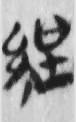○（盈）
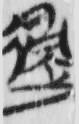歸
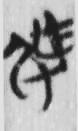{尸拃}（胙）
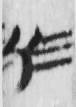於
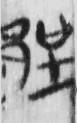郢
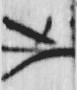之
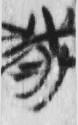歲（歲）
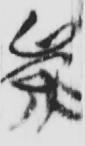○（爨）
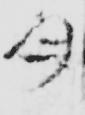月
